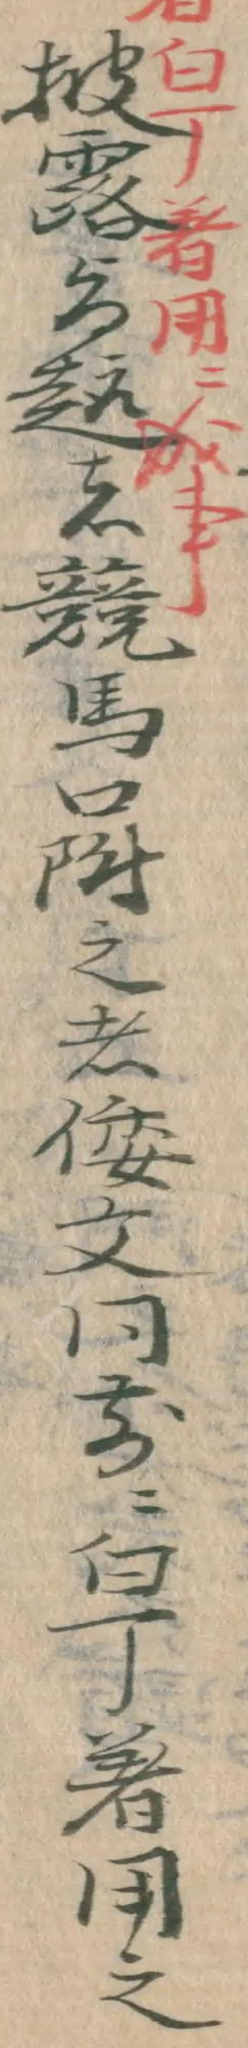披露旨趣者競馬口附之者倭文同前ニ白丁着用之
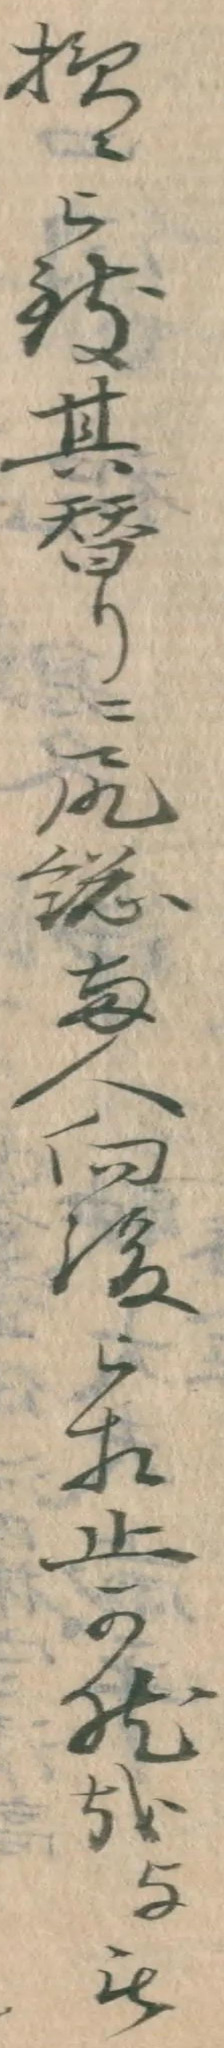様ニ被致其替りニ尻総両人向後被相止可然哉与被
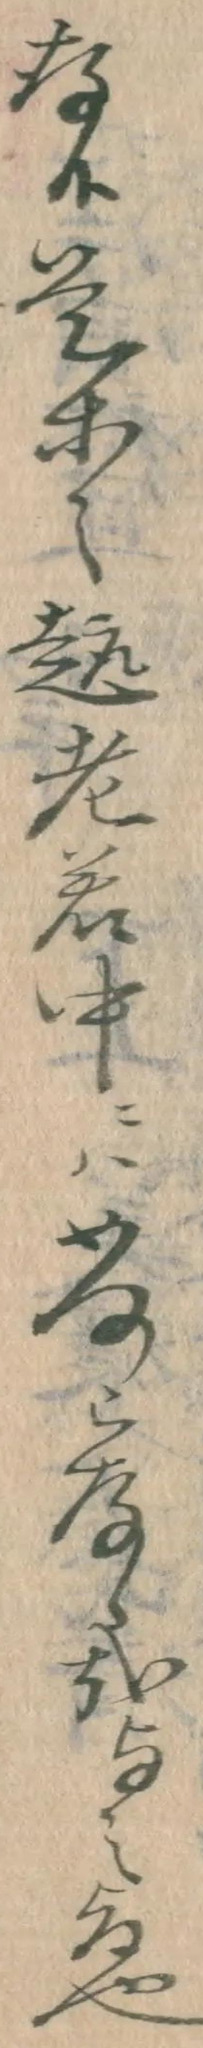存候是等之趣老若中ニハ如何被存候哉与之旨也
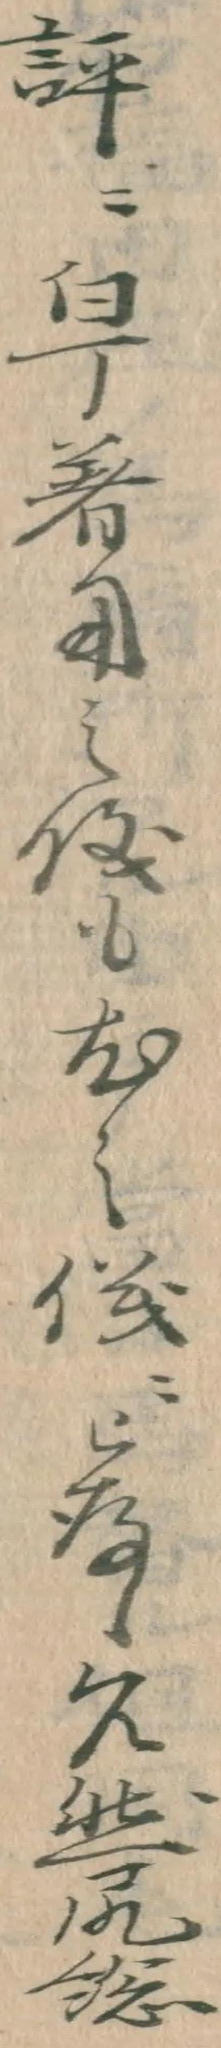評ニ白丁着用之儀も尤之儀ニ被存候乍然尻総
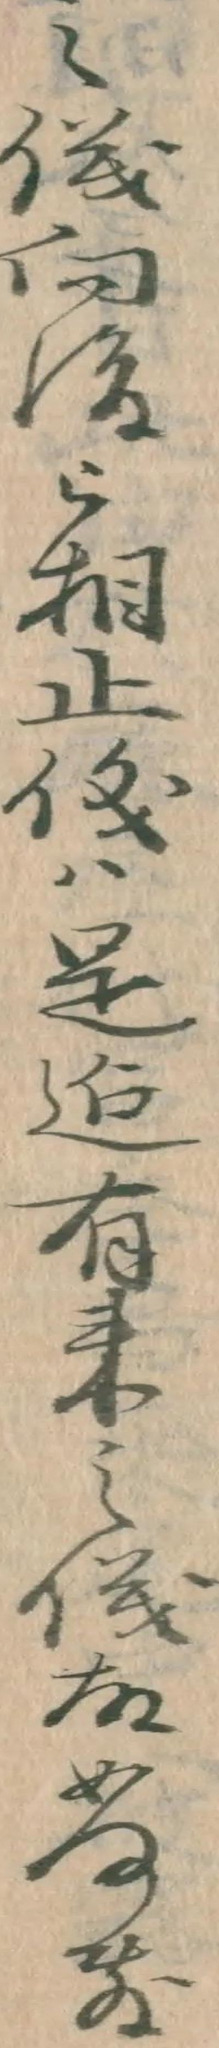之儀向後被相止儀ハ是迄有来之儀故如何敷
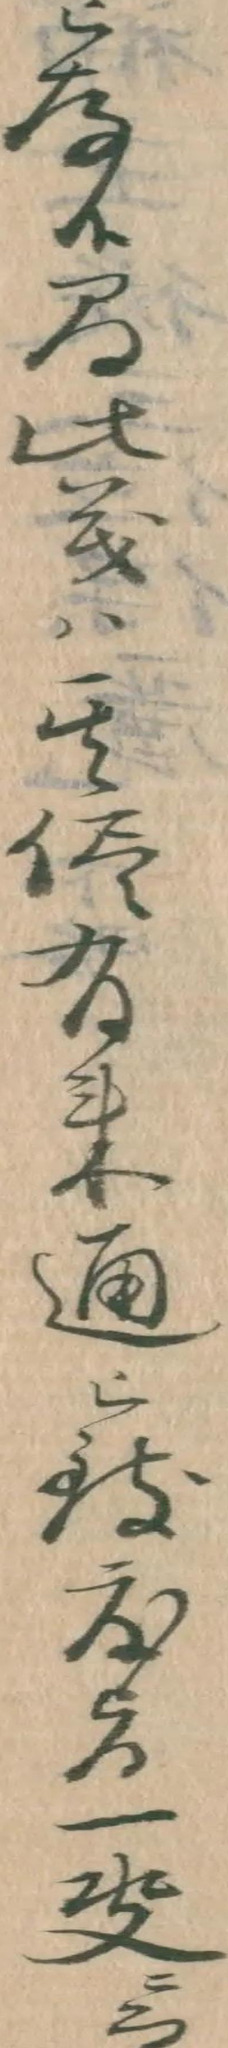被存候間此義ハ其侭有来通被致度旨一決ニ而
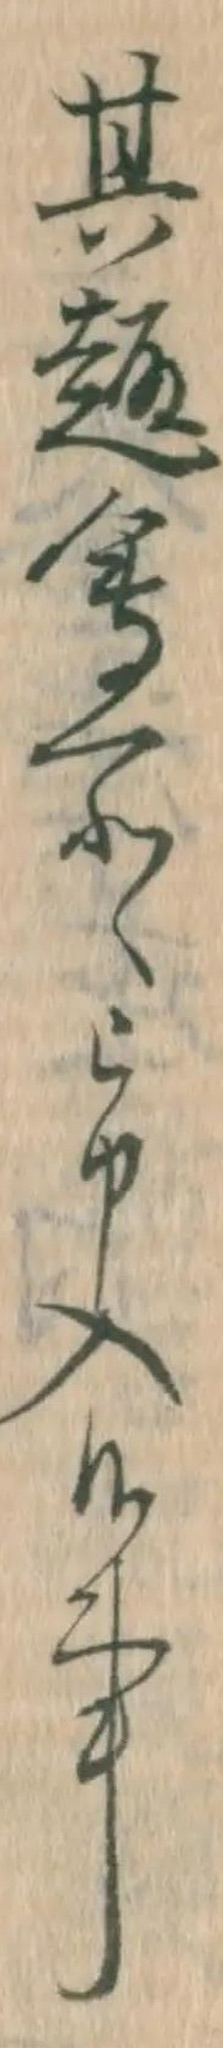其趣会所へ被申入候事
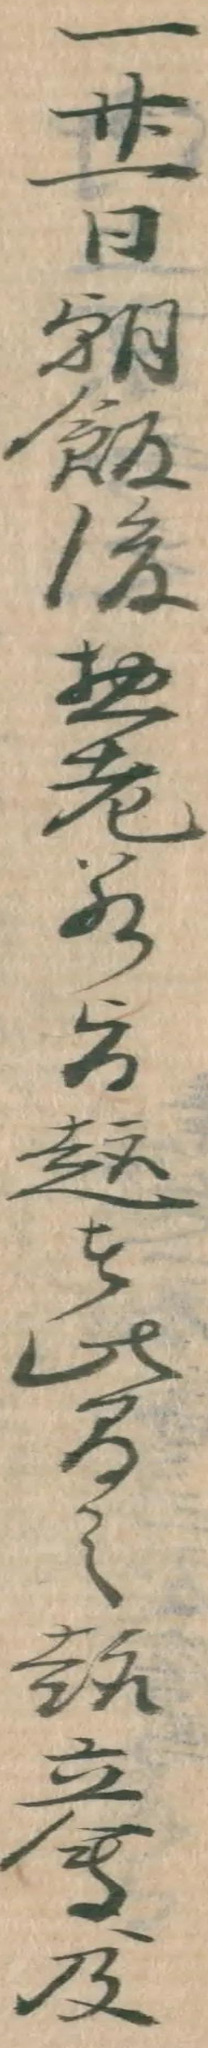一廿一日朝飯後惣老若旨趣者此間之趣立会へ及
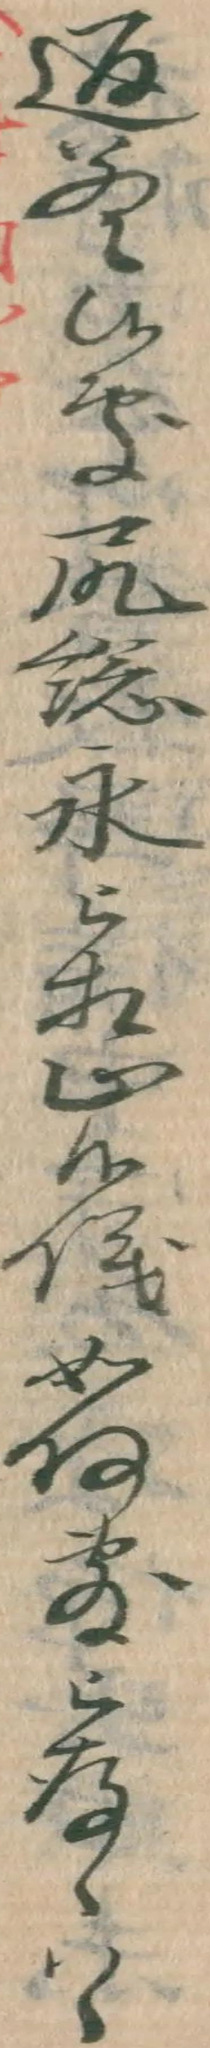返答候処尻総永被相止候儀如何敷被存候ハヽ
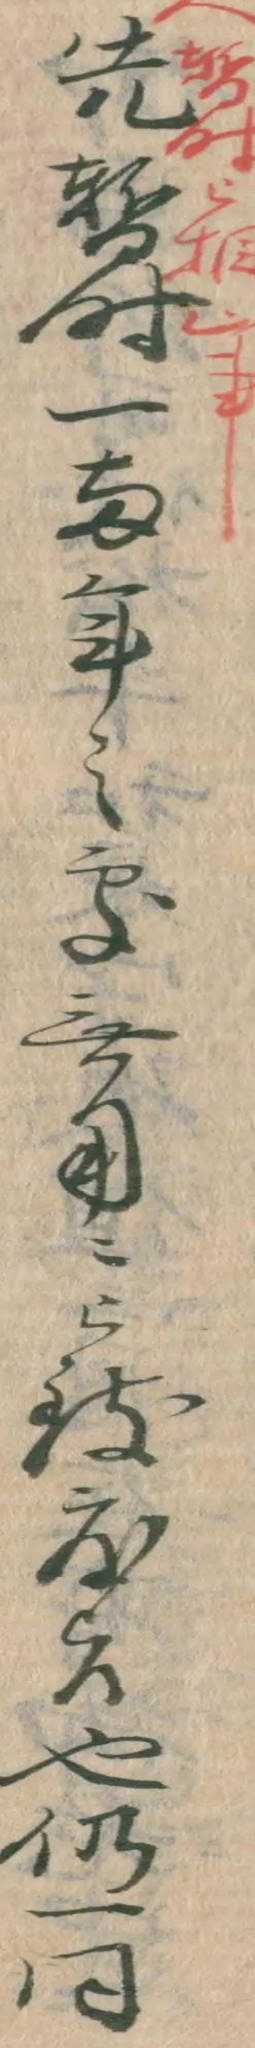先暫時一両年之処無用ニ被致度旨也仍一同
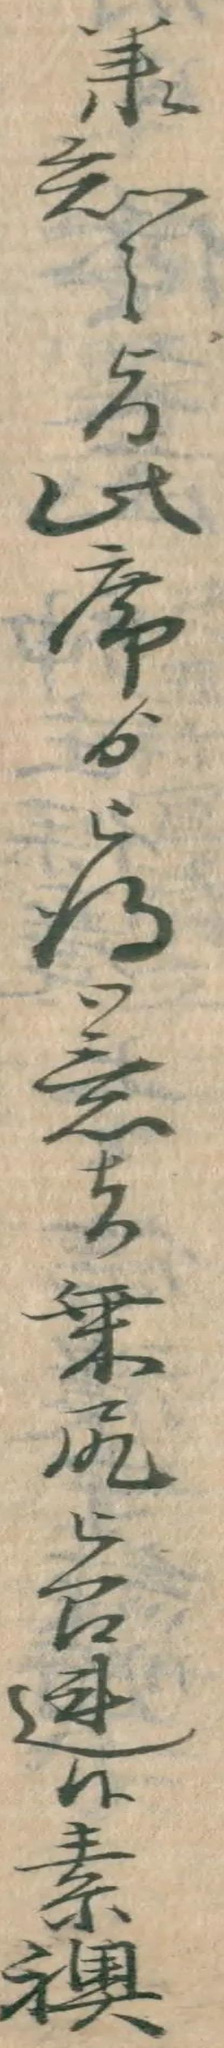承知之旨此席ゟ被得御意者乗尻被召連候素襖
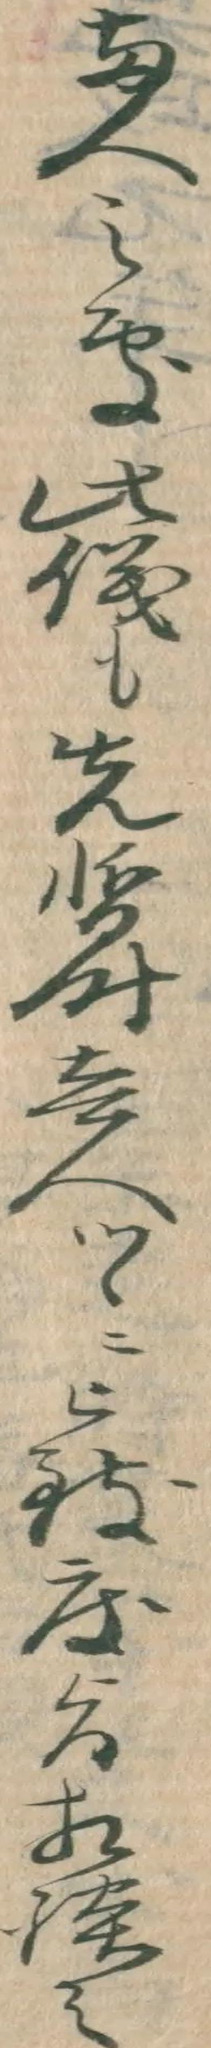両人之処此儀も先暫時壱人ツヽニ被致度旨相談之
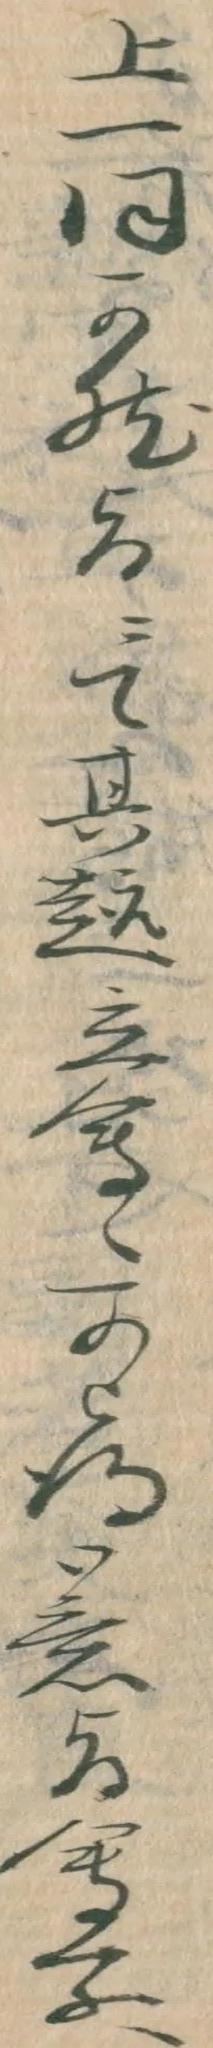上一同可然旨ニて其趣立会候可被得御意旨会所へ
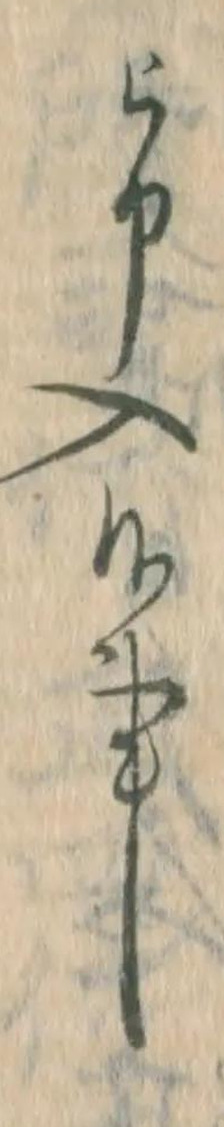被申入候事
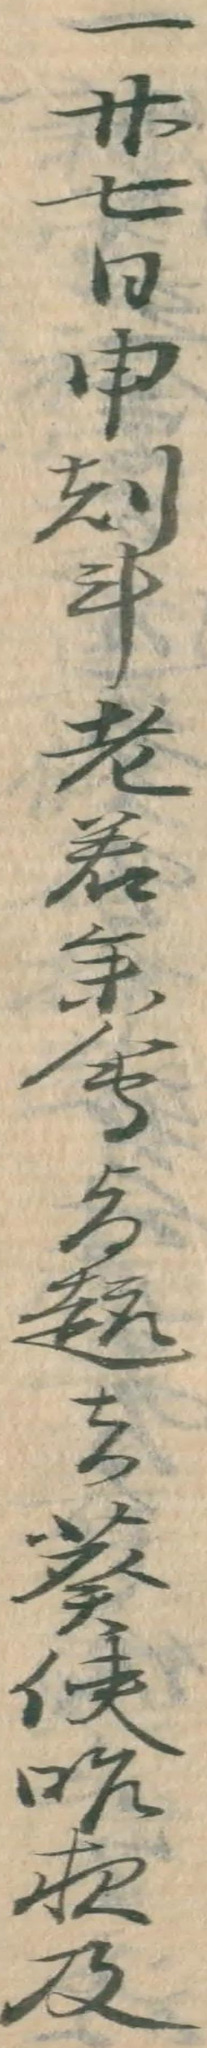一廿七日申刻計老若参会旨趣者葵使昨夜及
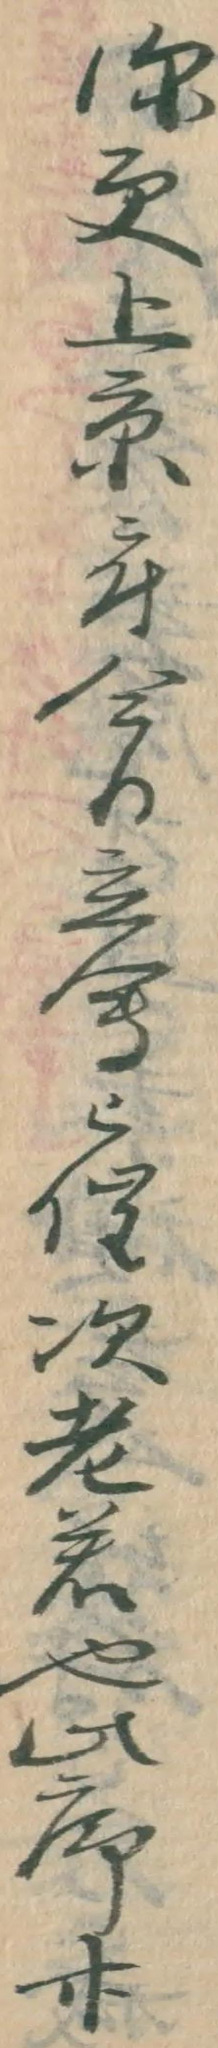深更上京ニ付今日立会被催次老若也此席廿
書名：賀茂社記録. 第10冊
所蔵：国立国会図書館 National Diet Library, JAPAN
